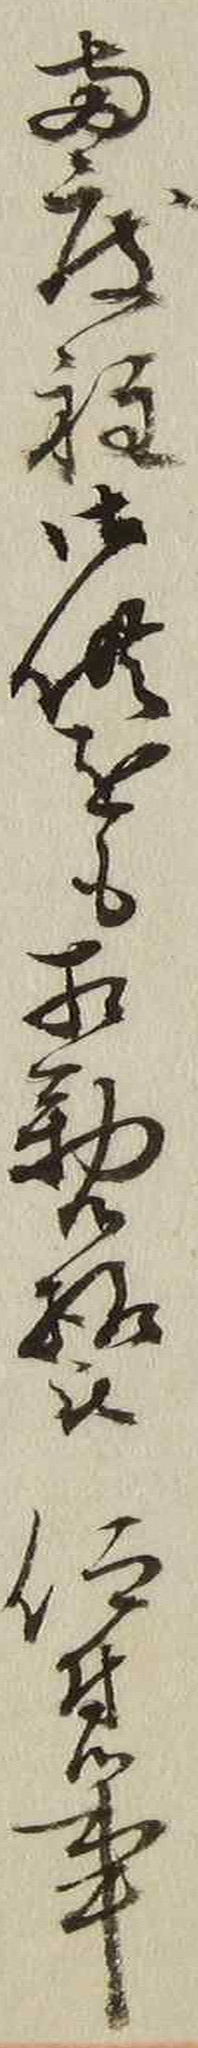両度程御供をも相勤候様被仰付候事
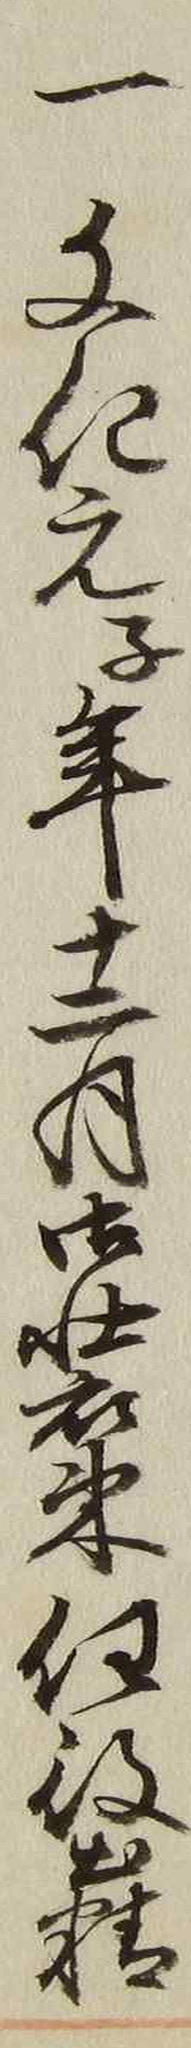一文化元子年十二月御装束任役出精
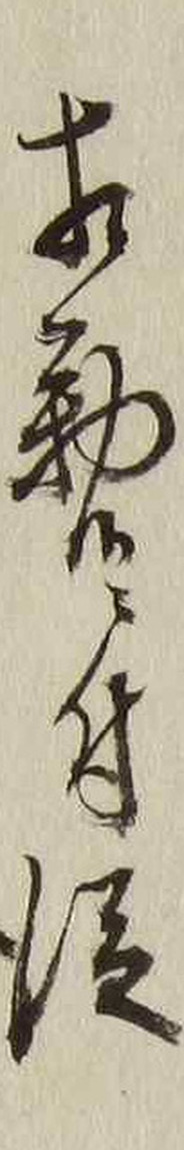相勤候付ニ従
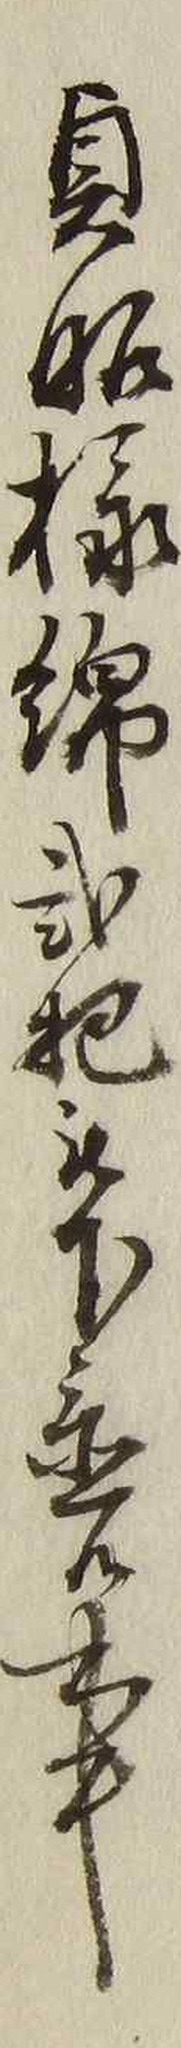貞昭様綿弐把被下置候事
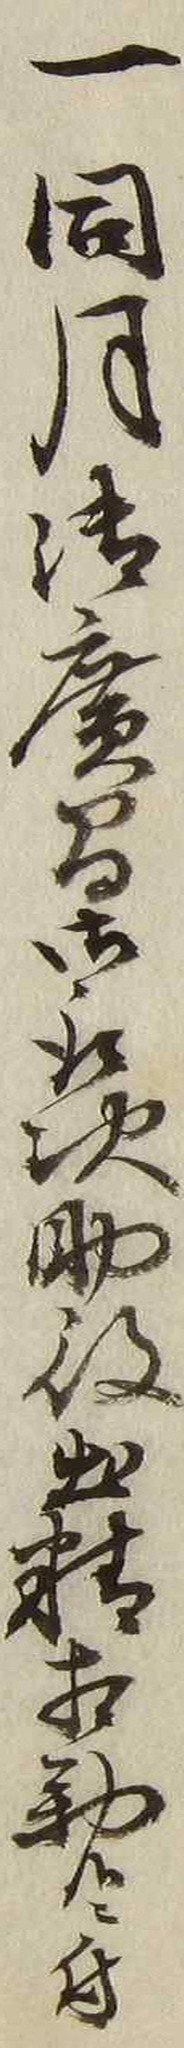一同月御広間御取次助役出精相勤候ニ付
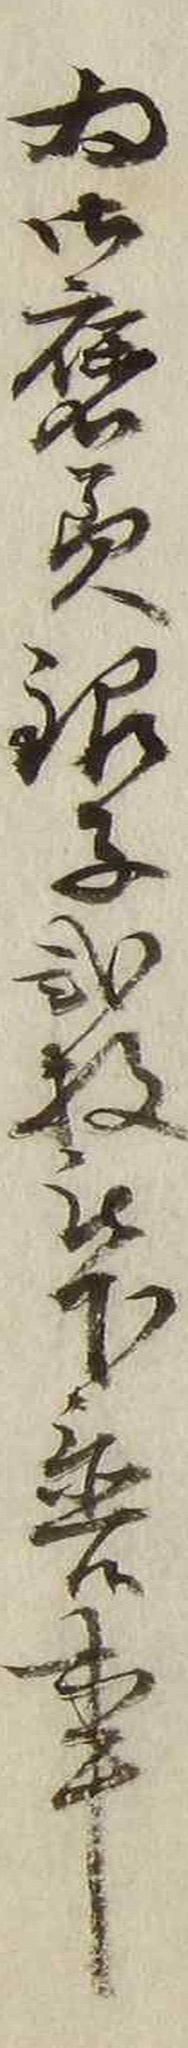為御褒美銀子弐枚被下置候事
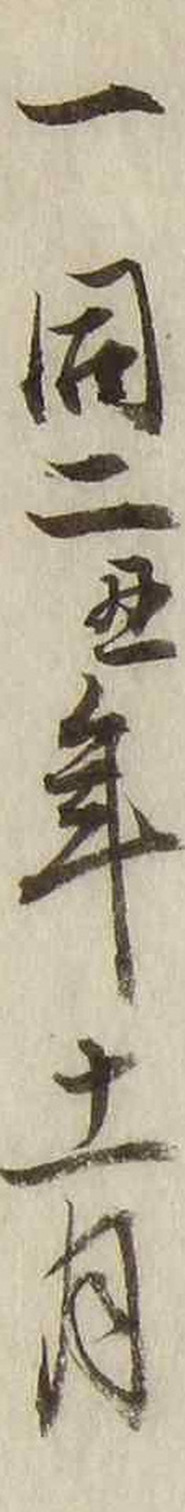一同二丑年十一月

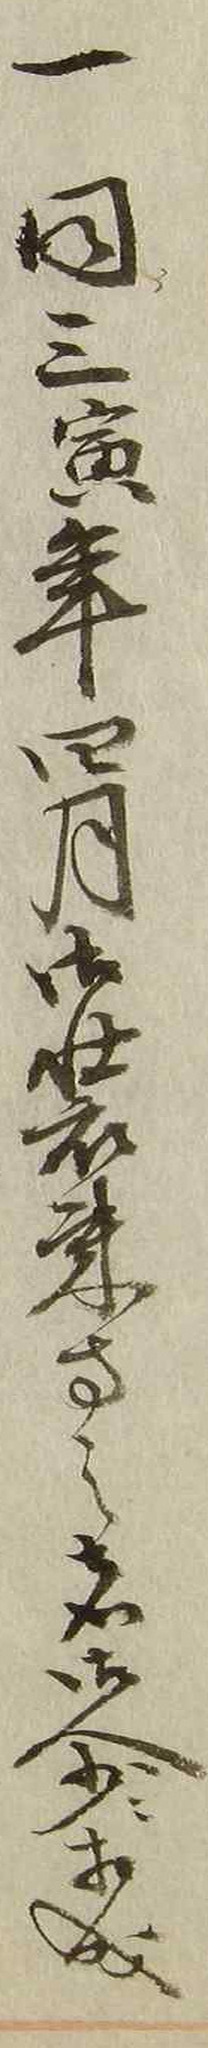一同三寅年四月御装束方之者御人少ニ相成
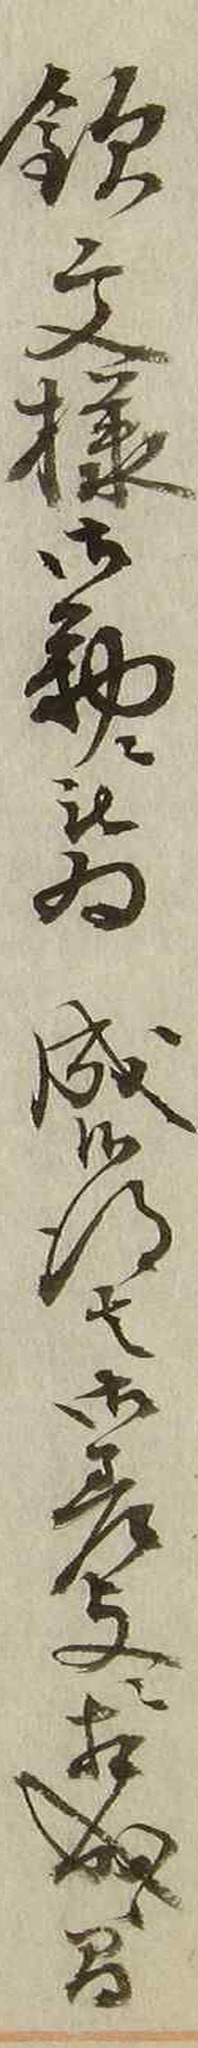欽文様御勤ニ被為成候得者御差支ニ相成候間
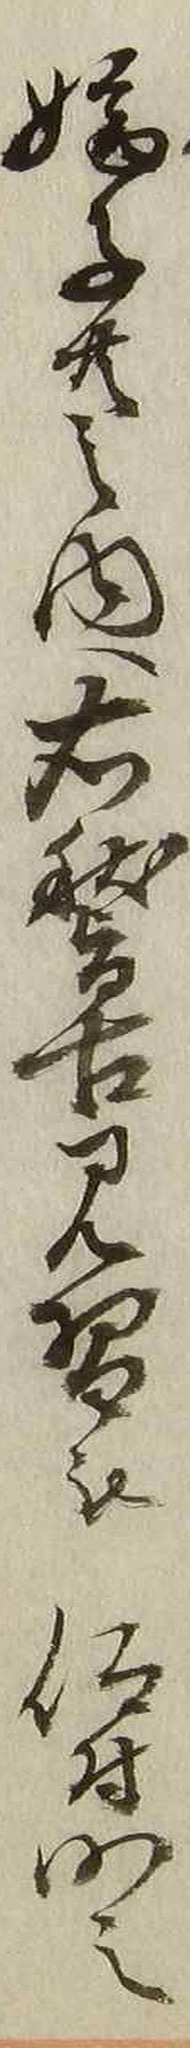嫡子共之内へ右稽古見習被仰付仍之
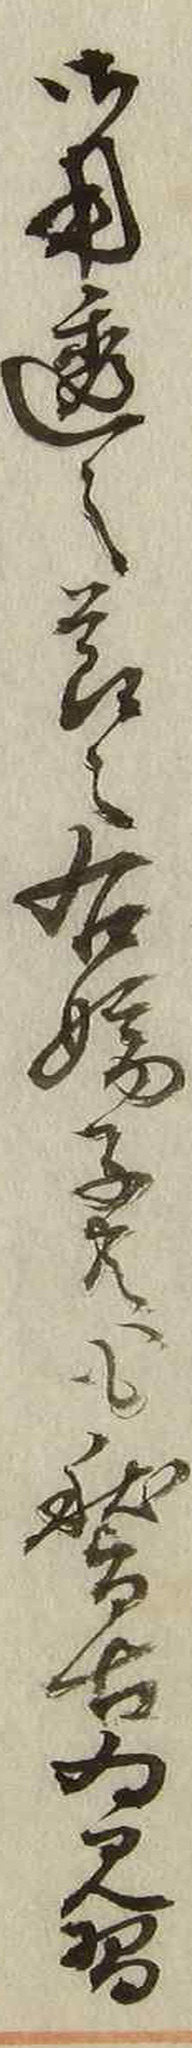御用透之節々右嫡子共へも稽古為見習
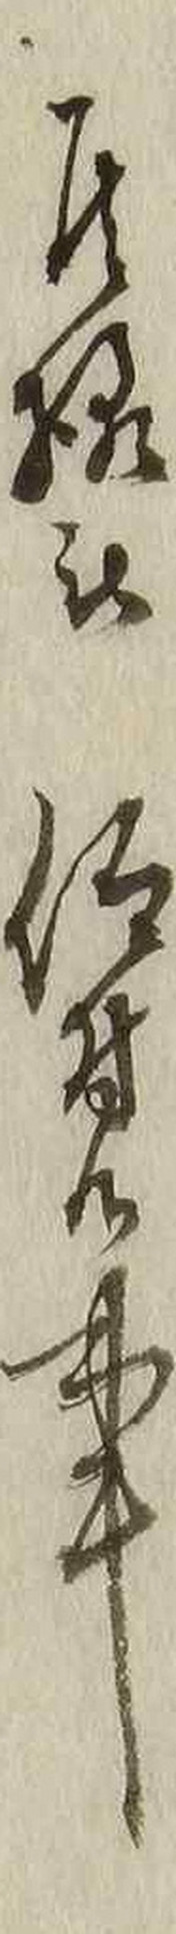候様被仰付候事
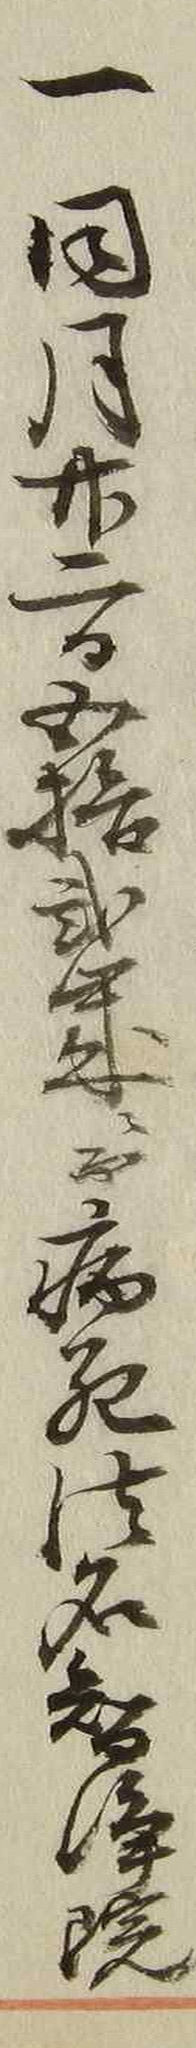一同月廿二日五拾弐歳ニ而病死法名智浄院
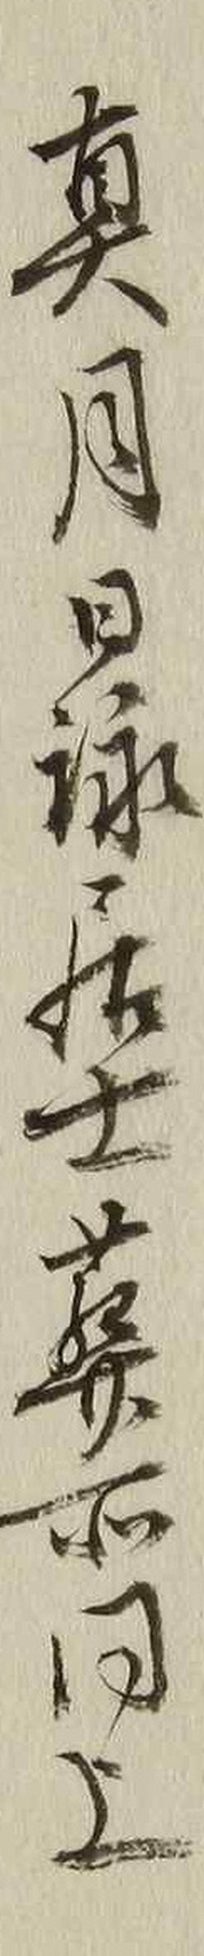真月日詠居士葬所同上
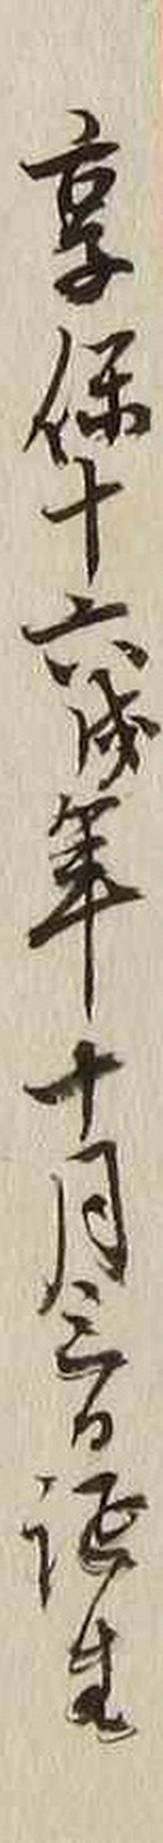享保十六戌年十月三日誕生
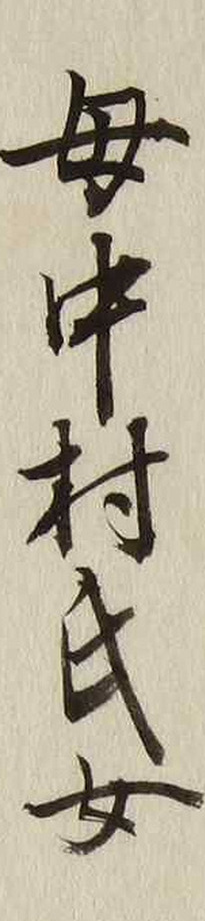母中村氏女
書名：諸士系譜　巻之23　い之部23
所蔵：会津若松市立会津図書館
